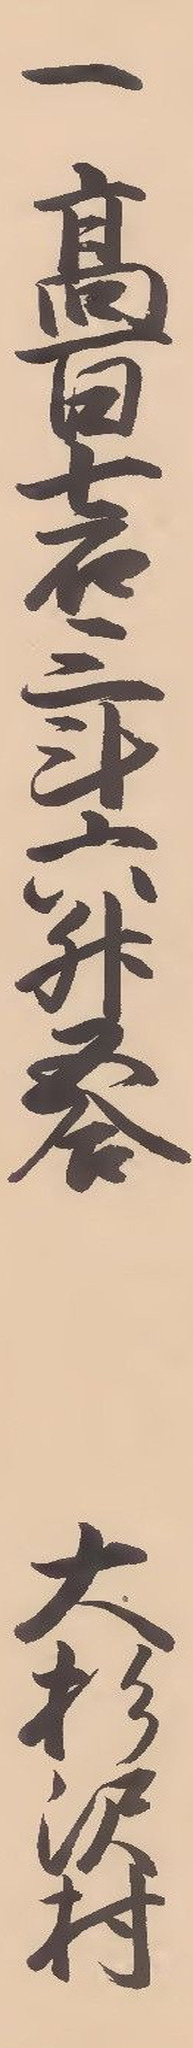一高百七石三斗六升五合大杉沢村
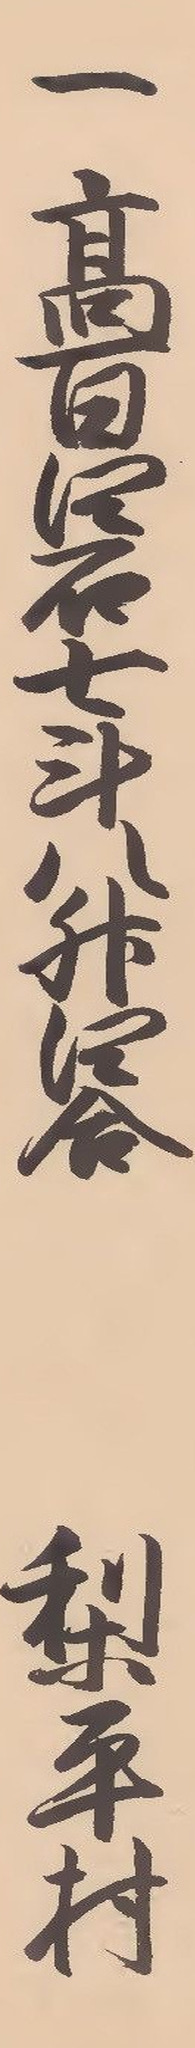一高百四石七斗八升四合梨平村
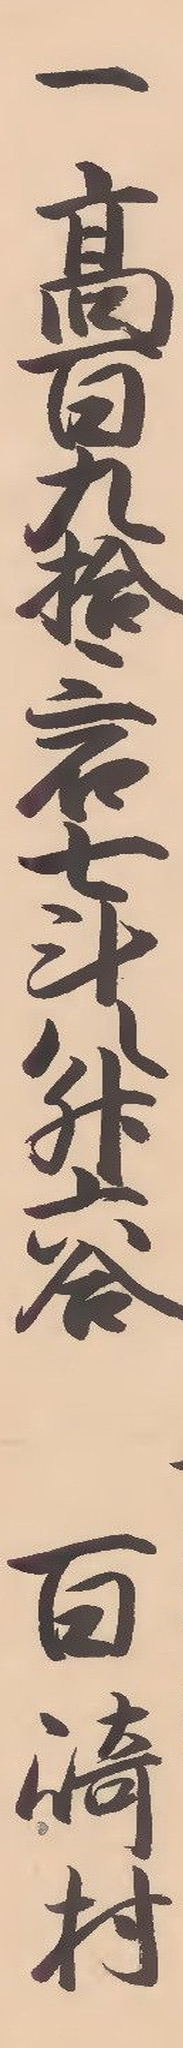一高百九拾三石七斗八升六合百崎村
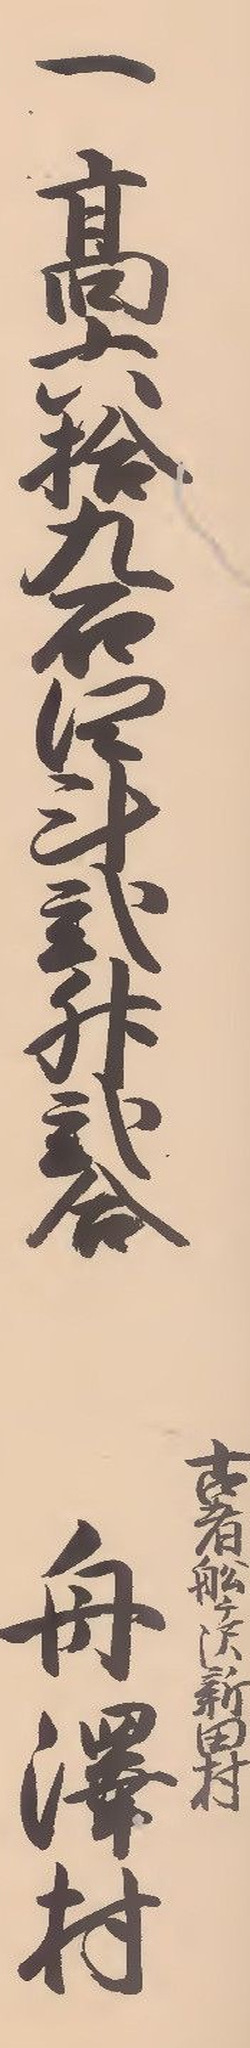一高六拾九石四斗弐升弐合舟沢村
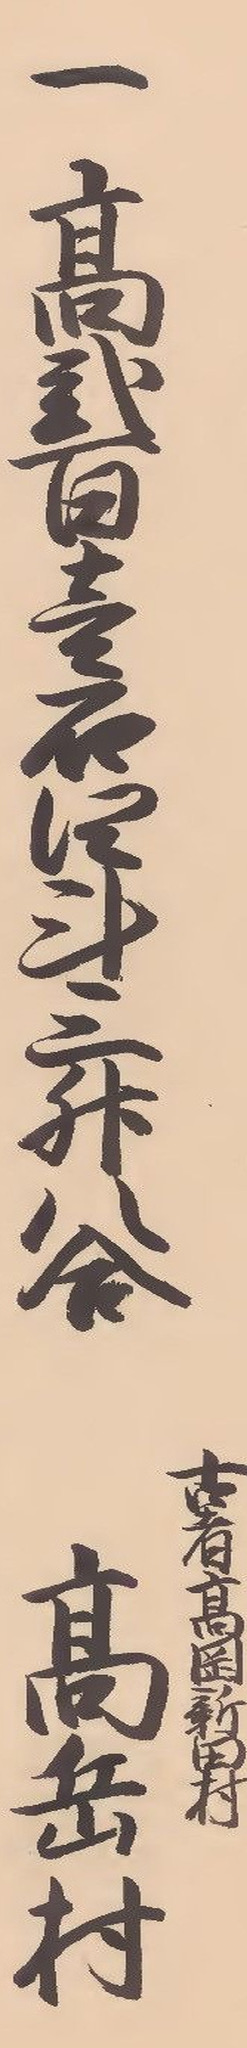一高弐百壱石四斗三升八合高岳村
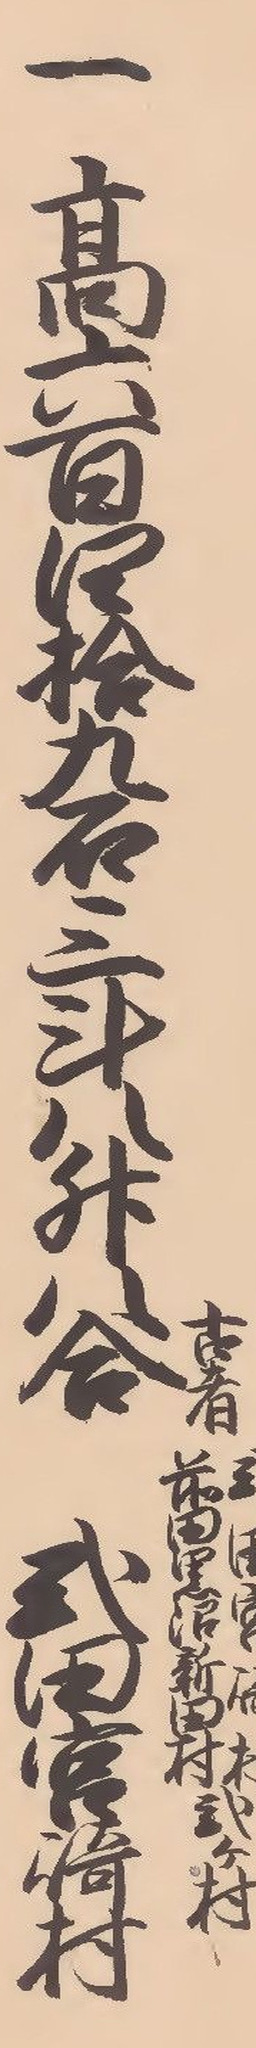一高六百四拾九石三斗八升八合式田宮崎村
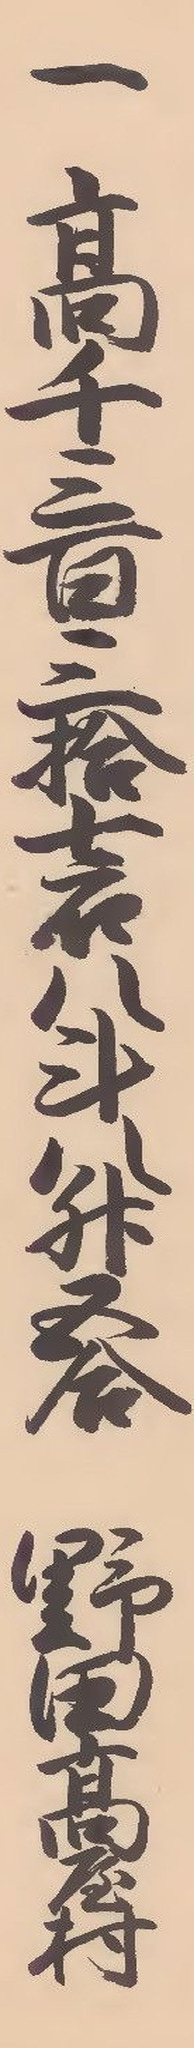一高千三百三拾七石八斗八升五合野田高屋村

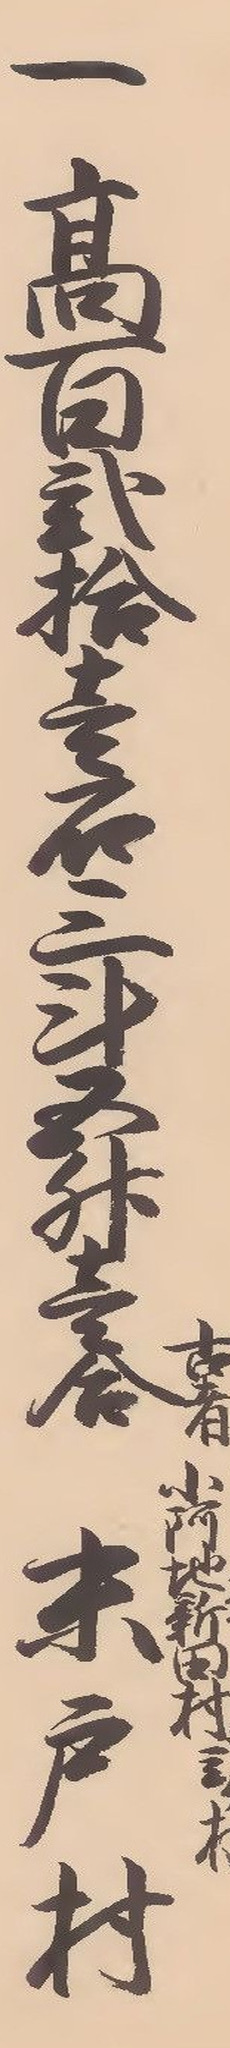一高百弐拾壱石三斗五升壱合末戸村
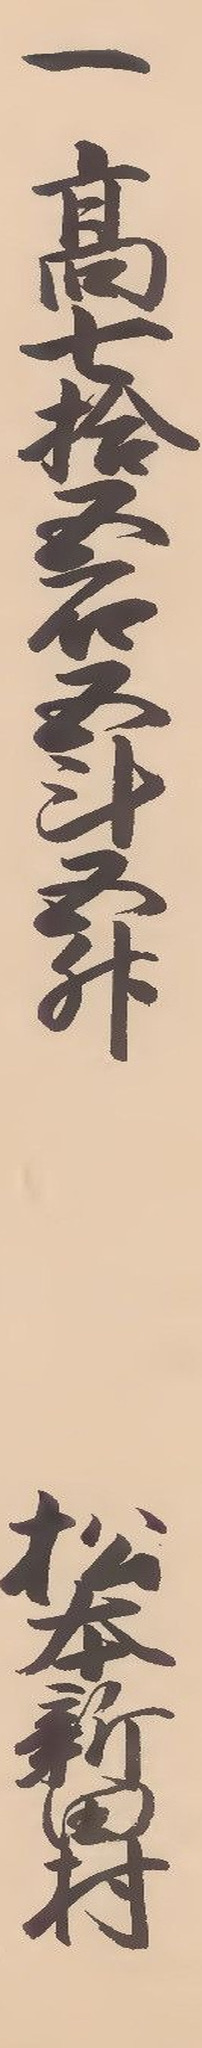一高七拾五石五斗五升松本新田村
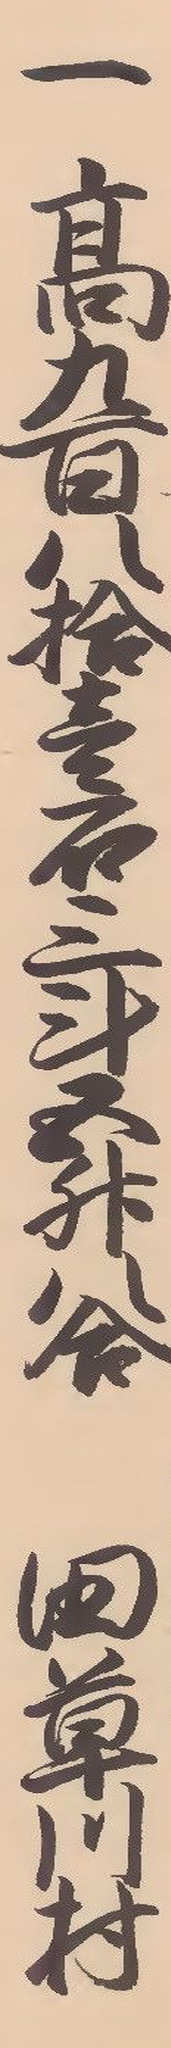一高九百八拾壱石三斗五升八合田草川村
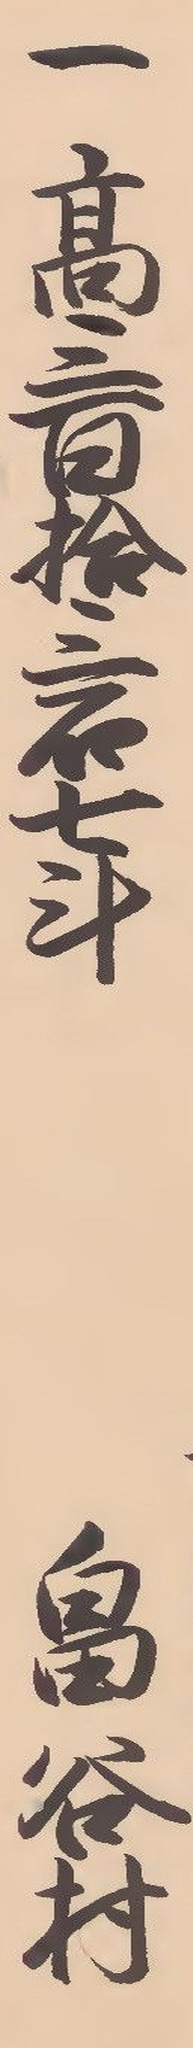一高三百拾三石七斗畠谷村
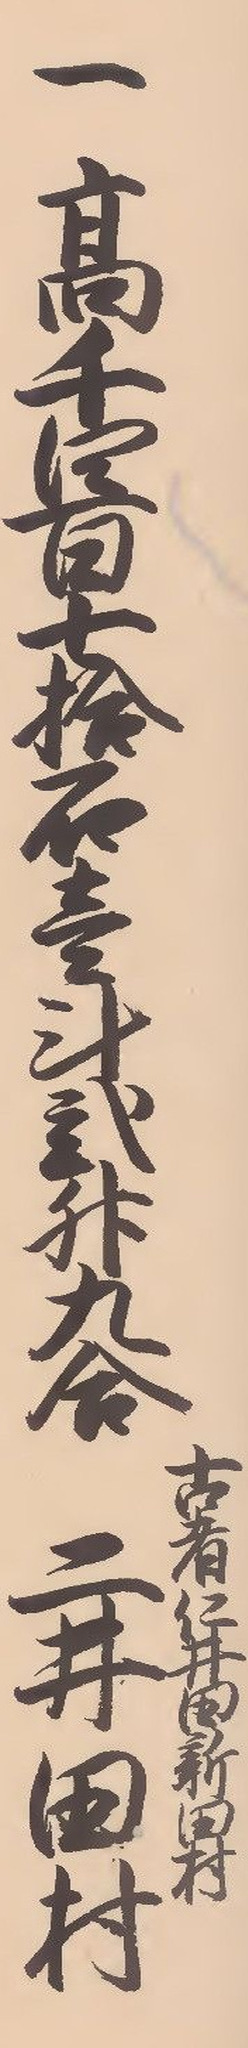一高千四百七拾石壱斗弐升九合二井田村
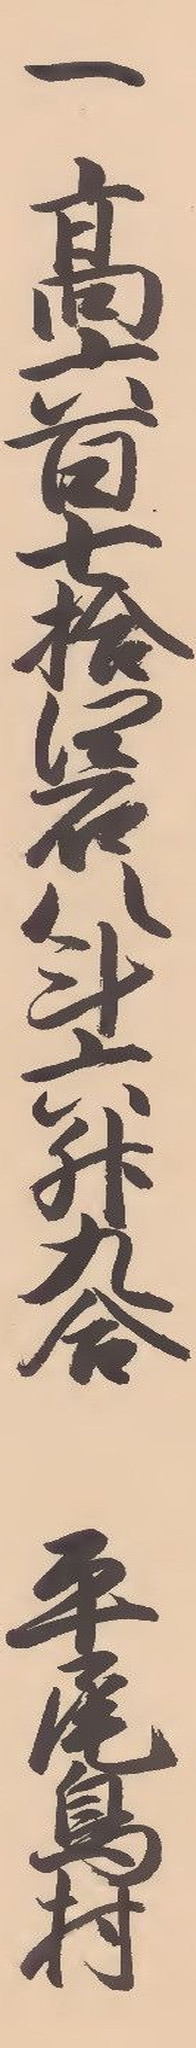一高六百七拾四石八斗六升九合平尾鳥村
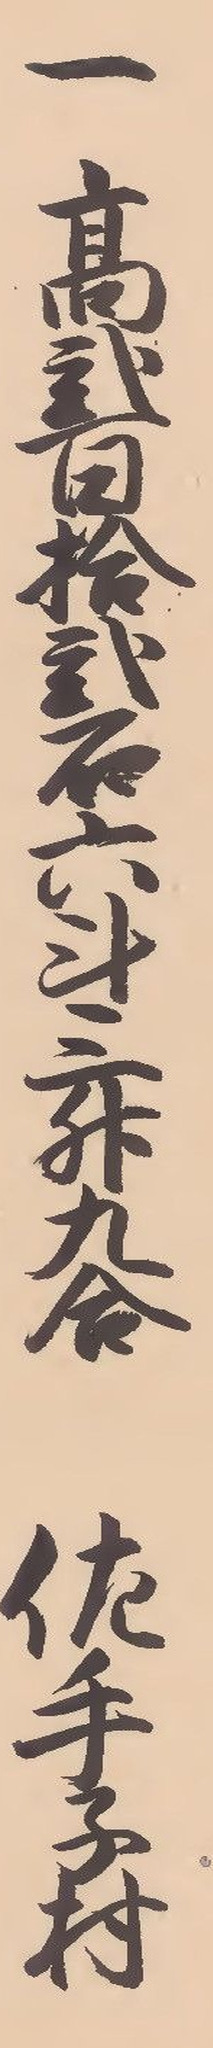一高弐百拾弐石六斗三升九合佐手子村
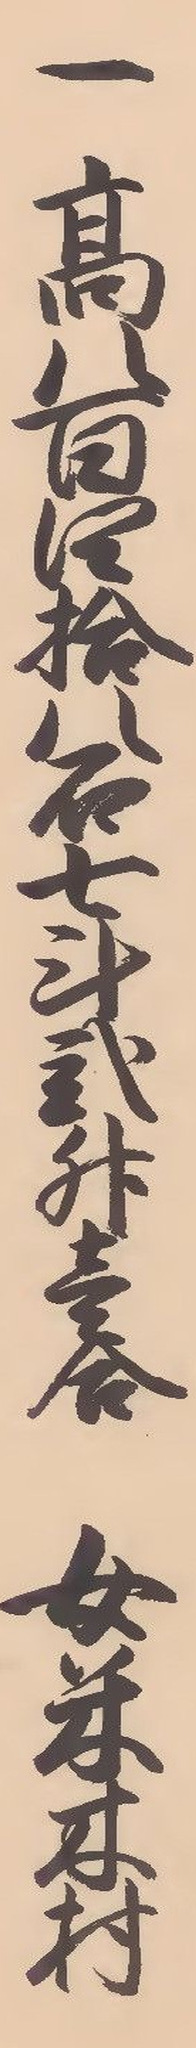一高八百四拾八石七斗弐升壱合女米木村

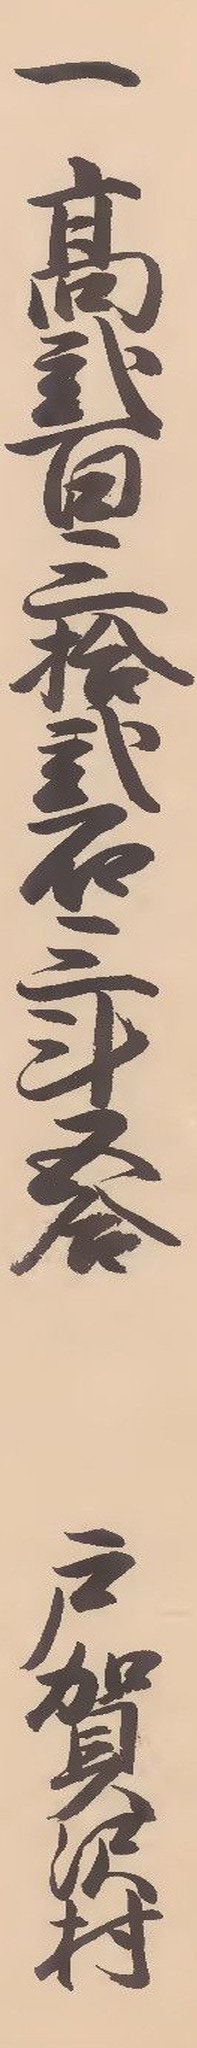一高弐百三拾弐石三斗五合戸賀沢村
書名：出羽国郷帳　５
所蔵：国立公文書館 National Archives of Japan
